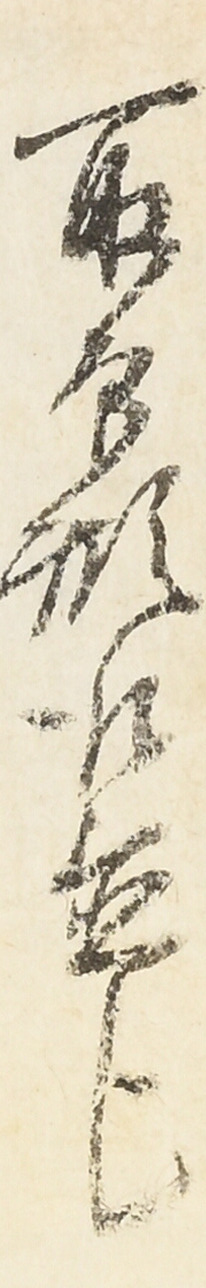取印形取置申候
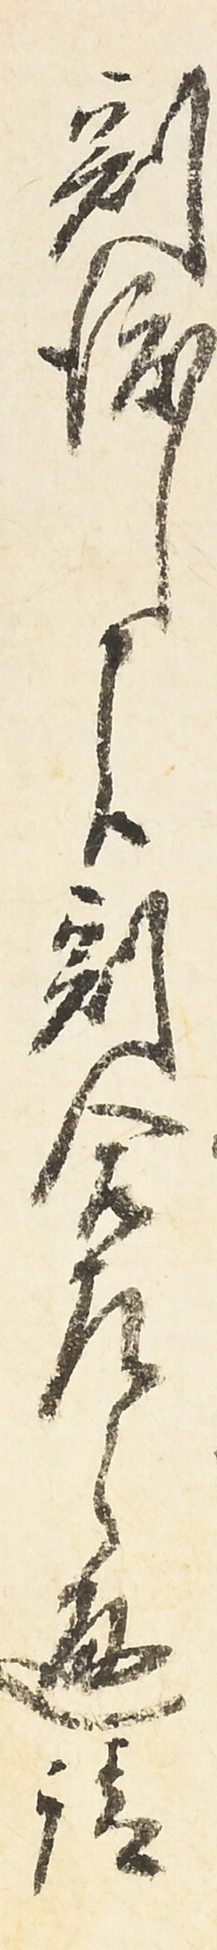割渡し申候割合左之通請
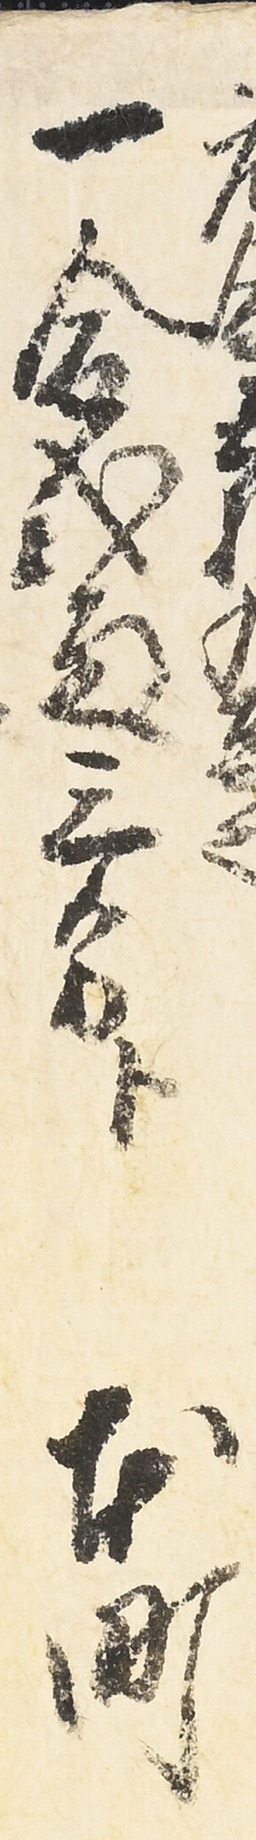一金弐両三分ト本町
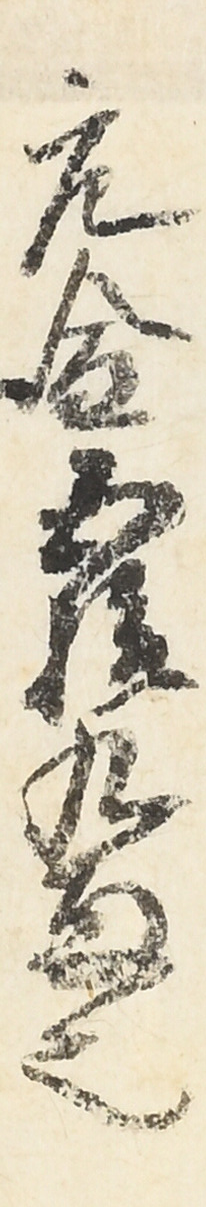元金五拾九両也
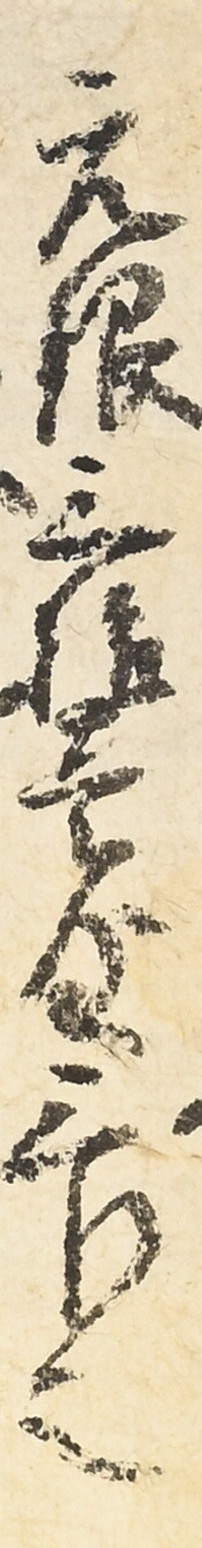元銀三拾壱匁三分也
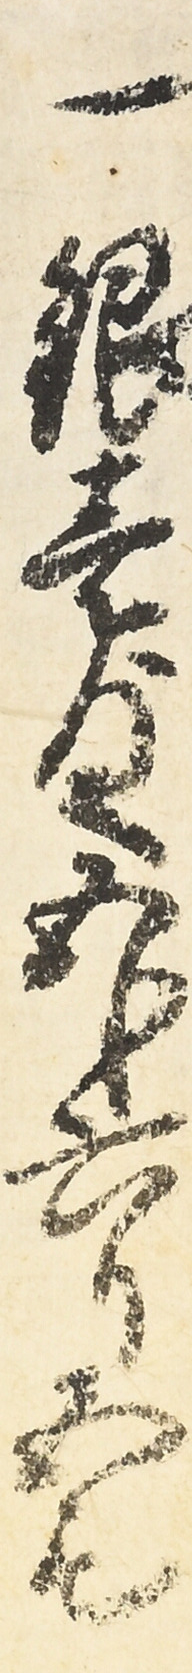一銀壱匁五分六厘五毛
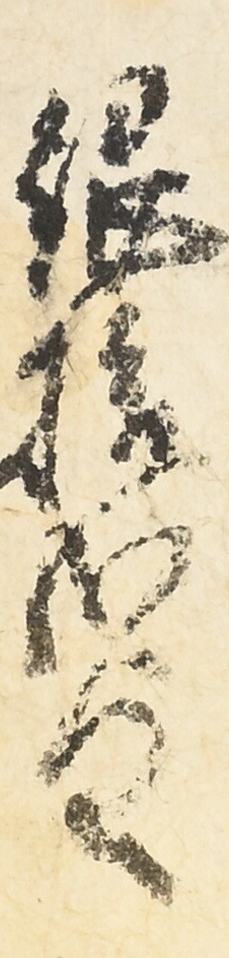銀拾弐匁
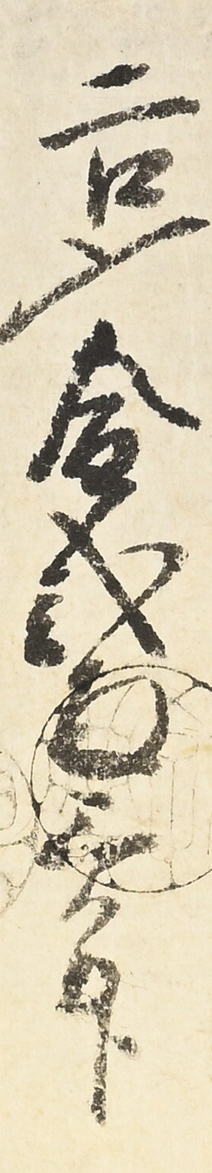二口〆金弐両三分ト
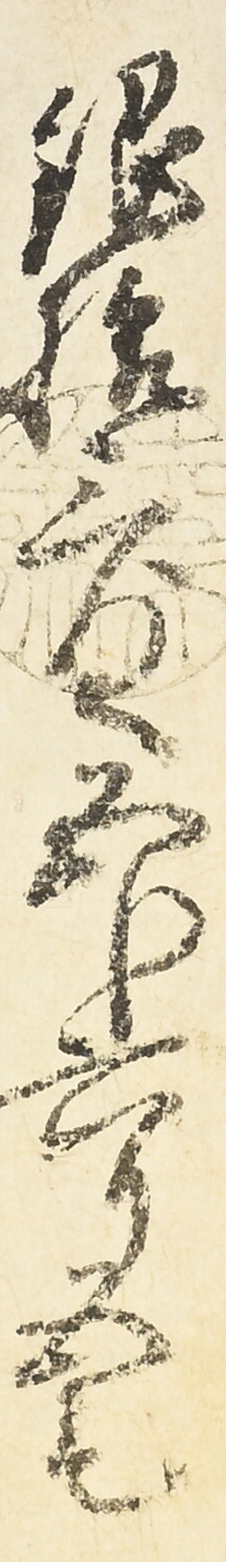銀拾三匁五分六厘五毛
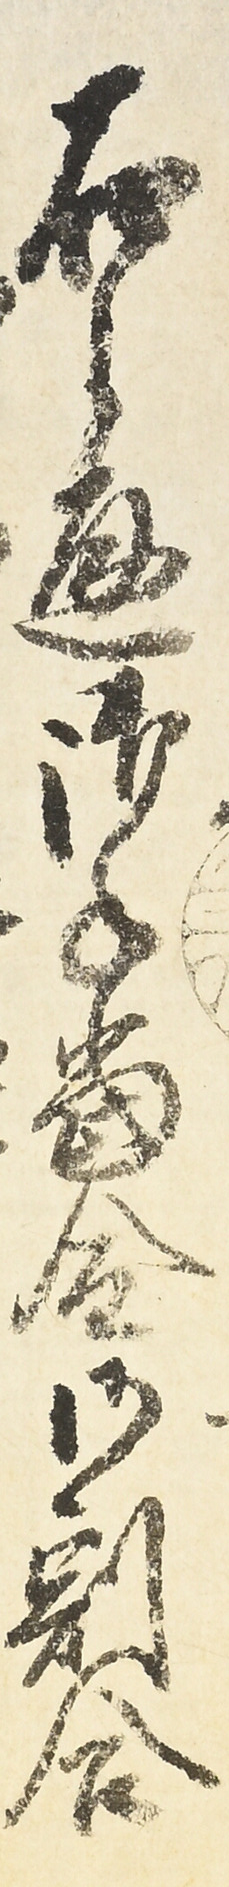右之通御手当金御割合
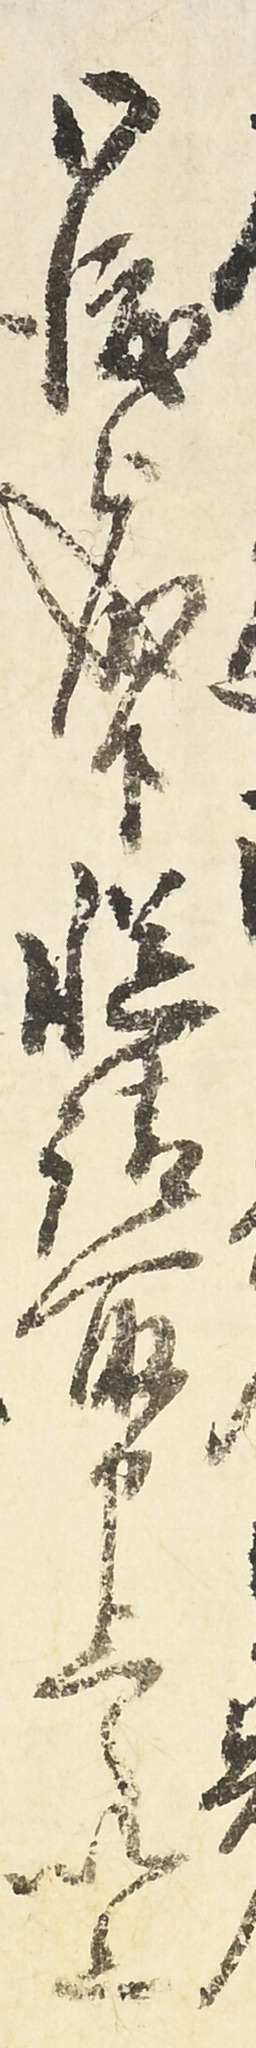御渡被成下慥請取申上候以上
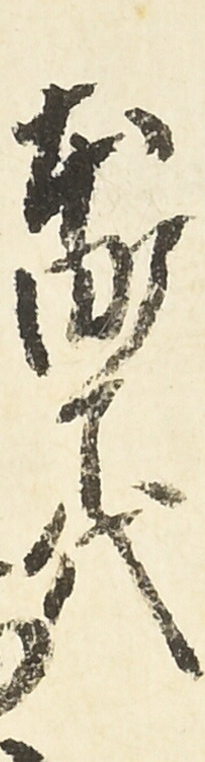本町町代
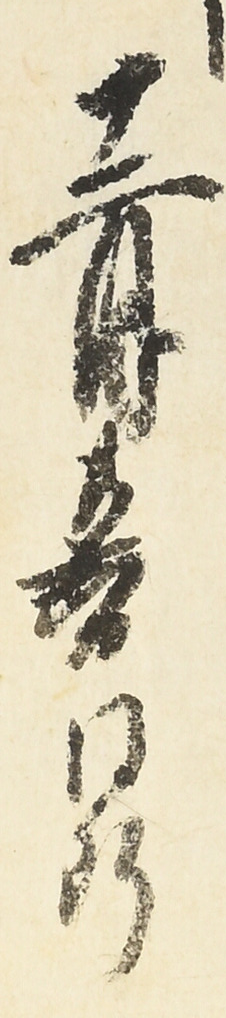十二月廿五日同断
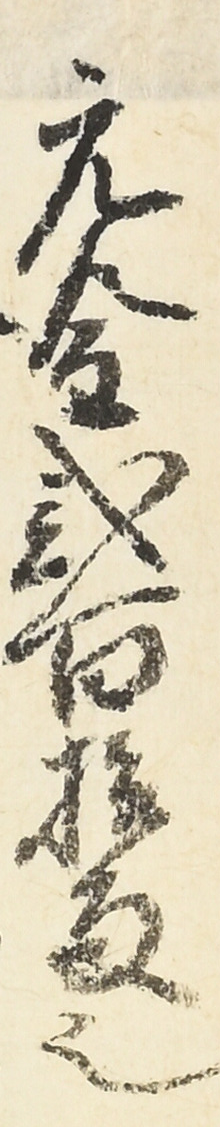元金弐百拾両也
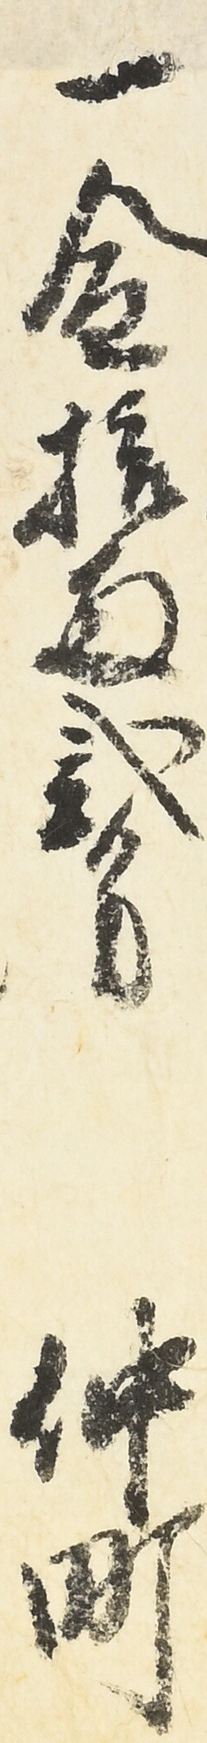一金拾両弐分仲町
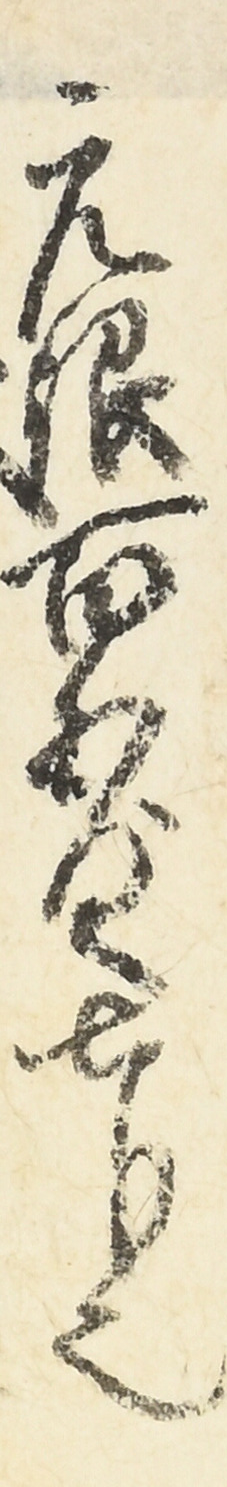元銀百五匁七分也
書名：御才覚金御利足割渡扣帳
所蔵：伊那市立高遠町図書館・合同会社AMANE
